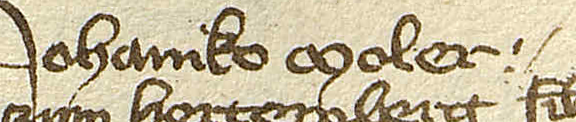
Iohaniko Moler . /
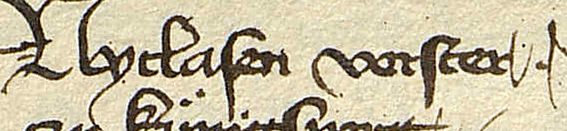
Nyclaſen verſter . /
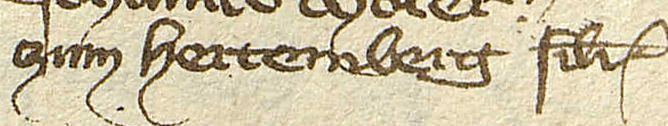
cʒum hertemberg ſilr*
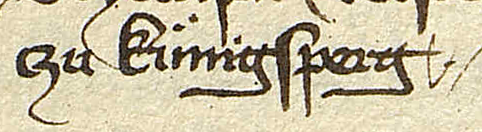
cʒu künigſperg . /
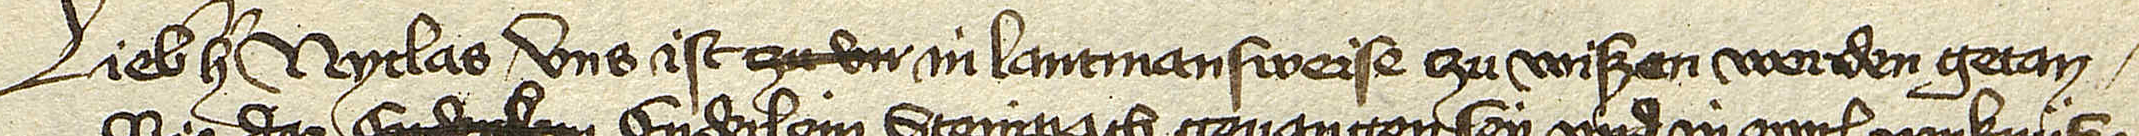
Lieb* h* Nyclas / Vns iſt cʒu vn in lantmanſweiſe cʒu wiſʒen worden getan /
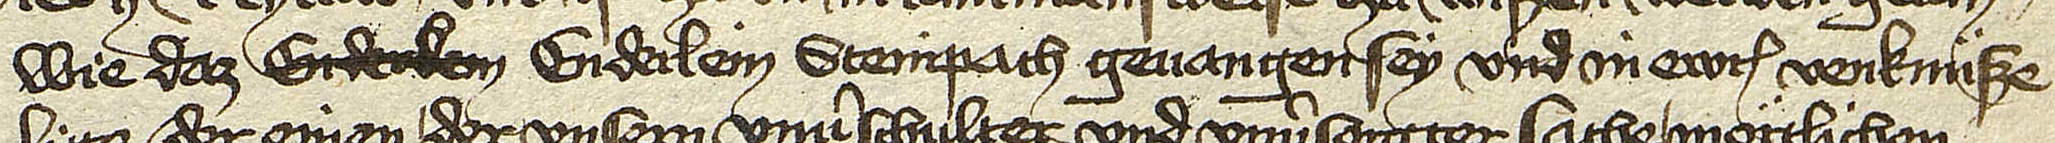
wie daʒ Enderlein Enderlein Steinpach geuangen ſey vnd in ewr* venknüſʒe
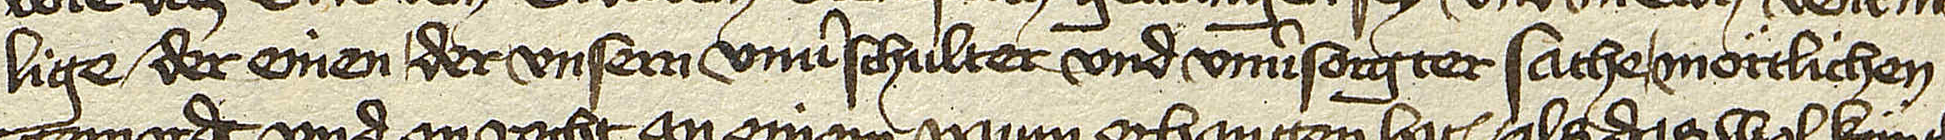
lige / der einen / der vnſern vnu*ſchulter vnd vnu*ſorgter ſache mörtlichen
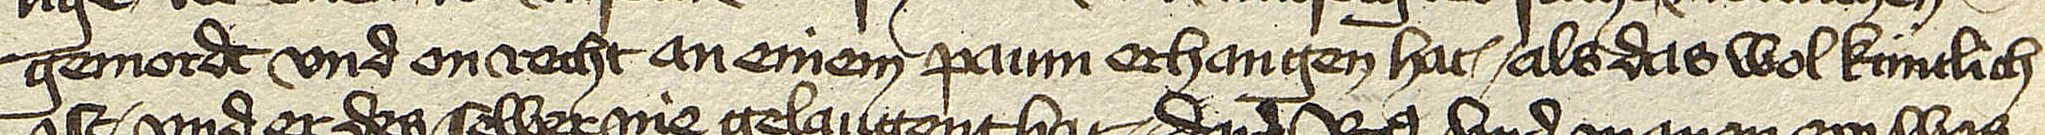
gemordt vnd on recht an einem paum erhangen hat / als das wol küntlich
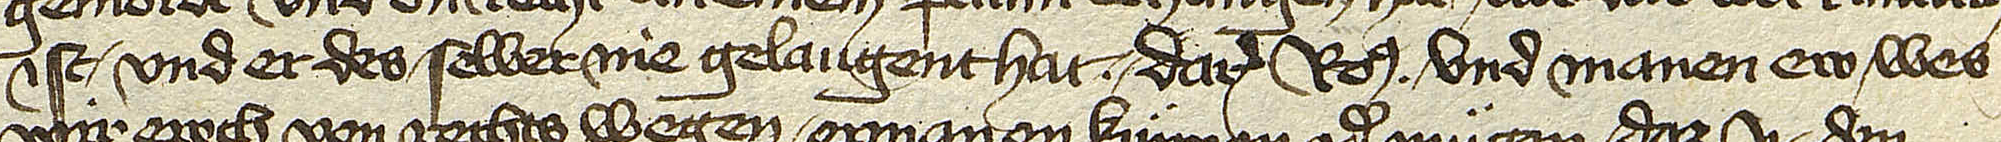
iſt / vnd er des / ſelber nie gelaugent hat . / dar* Ro* . / vnd manen ew / wes
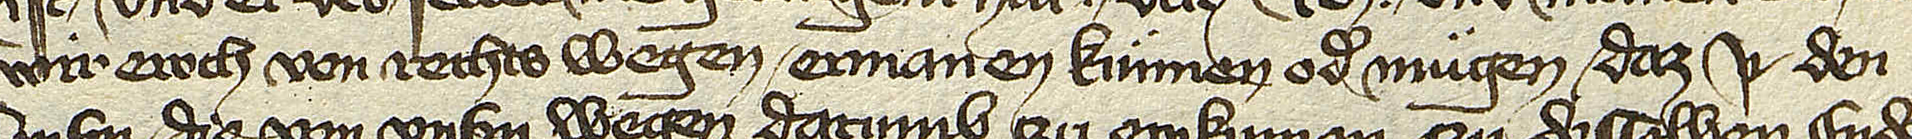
wir ewch von rechts wegen / ermanen künnen od* mügen / daʒ Ir den
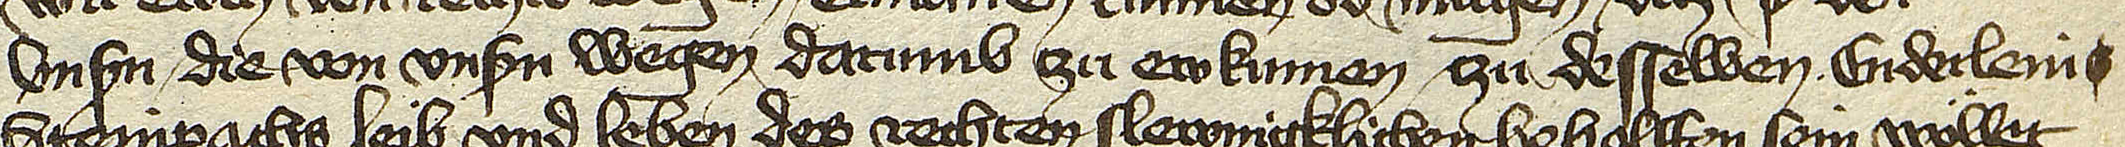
vnſ*n / die von vnſ*n wegen darumb cʒu ew kumen / cʒu deſſelben Enderleins
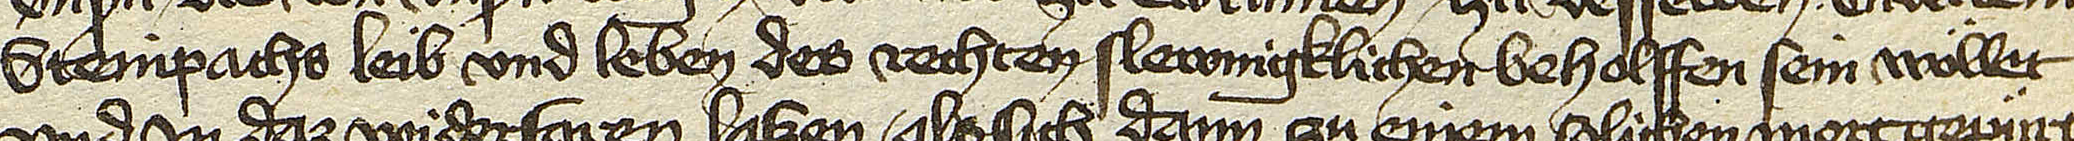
Steinpachs leib vnd leben des rechten ſlewnigklichen beholffen ſein wöllet
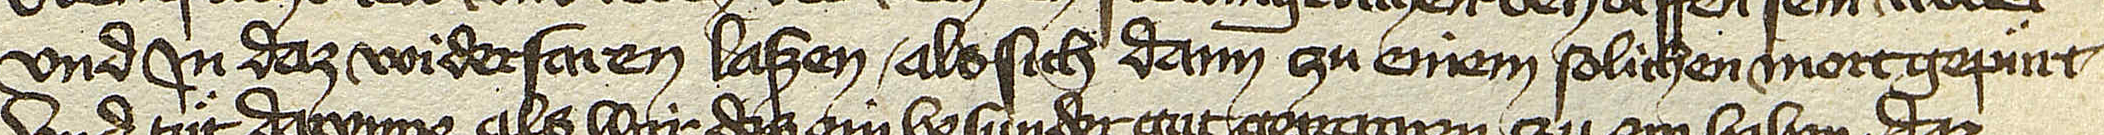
vnd In daʒ widerfaren laſʒen / als ſich dann cʒu einem ſolichen mort gepürt /
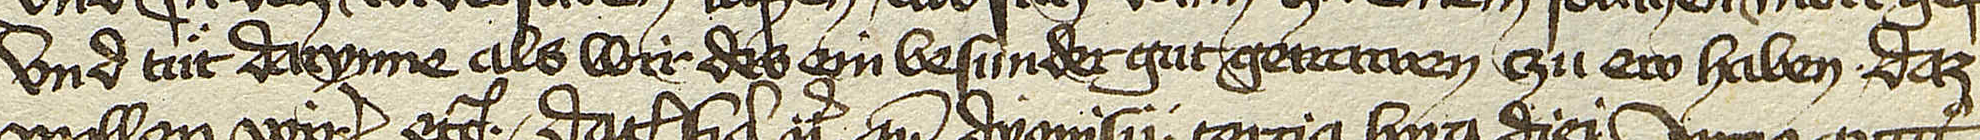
vnd tüt darynne als wir des ein beſunder gut getrawen cʒu ew haben daʒ
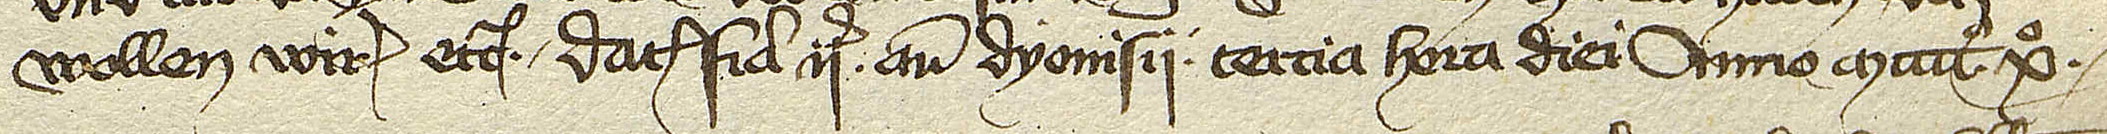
wollen wir § ecc* . / dat* fia* ii* . an* dyoniſii* tercia hora diei Anno Mcccc* x* . /
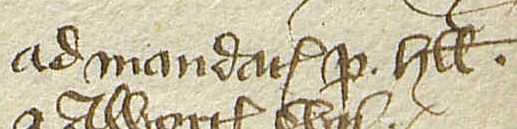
ad mandat* p . hll* .
